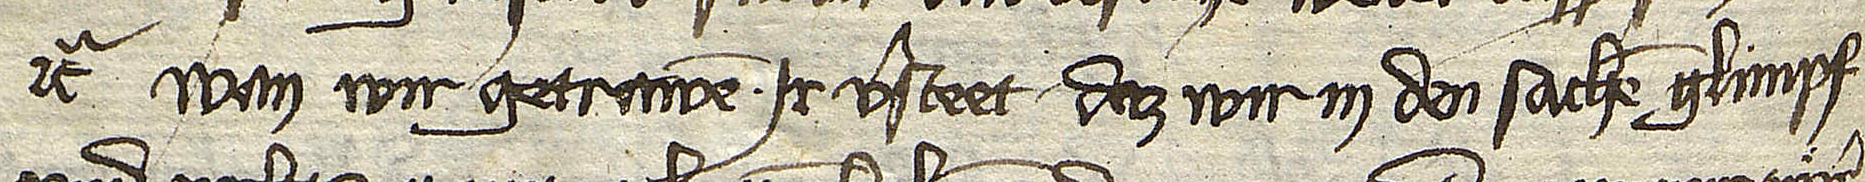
ec* wan wir getrawe* Ir v*ſteet / daʒ wir in den ſache* glimpf
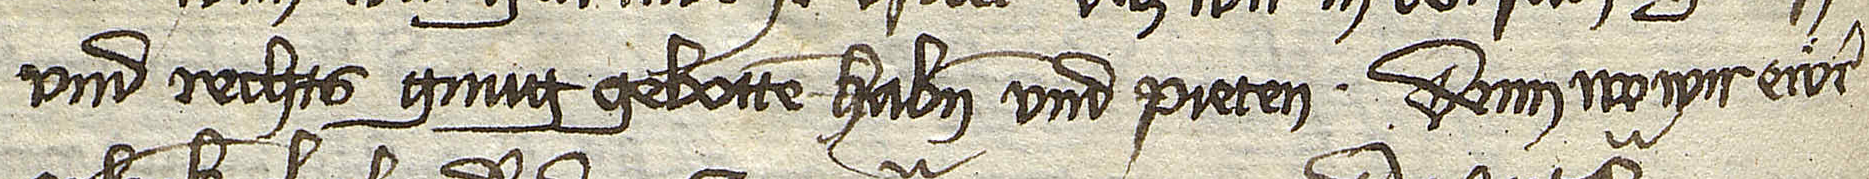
vnd rechts gnug gebotte* habn* vnd pieten . Denn wo wir eẅr*
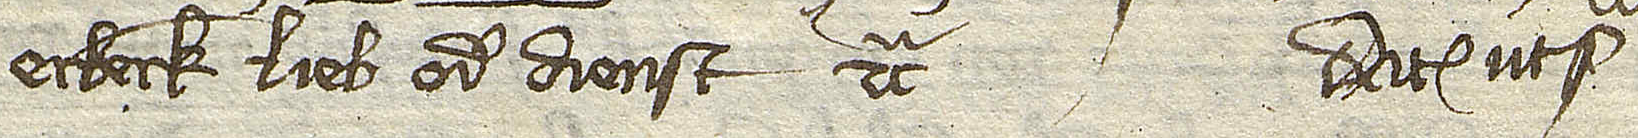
erberk* lieb od* dienſt ec* Dat* ut ſ*
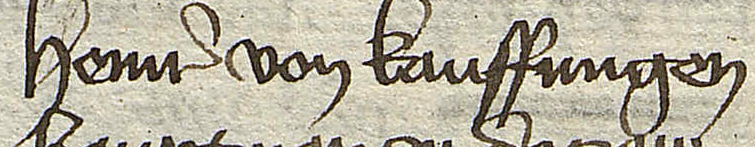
heinr* von kauffungen
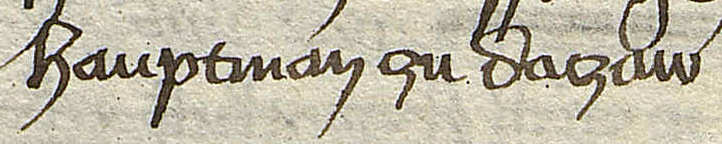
hauptman cʒu Dacʒaw
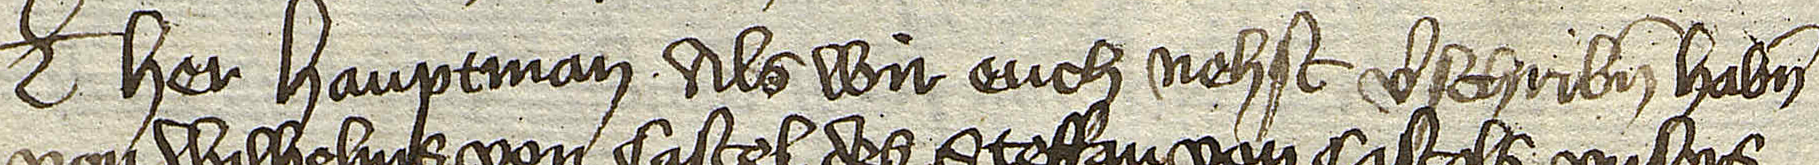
L* her hauptman . Als wir euch nehſt v*ſchribn* habn*
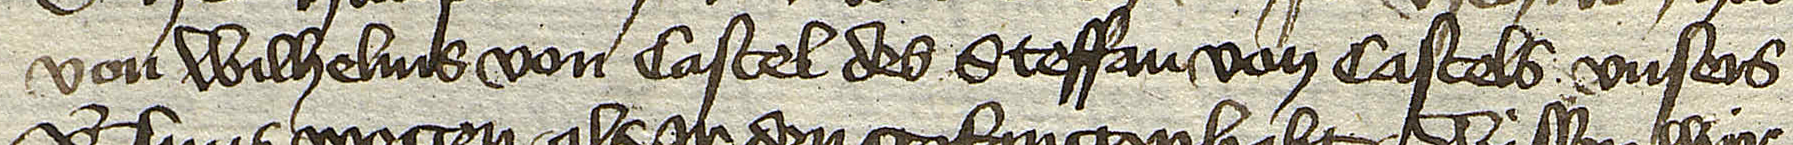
von wilhelms von Caſtel des Steffan von Caſtels vnſers
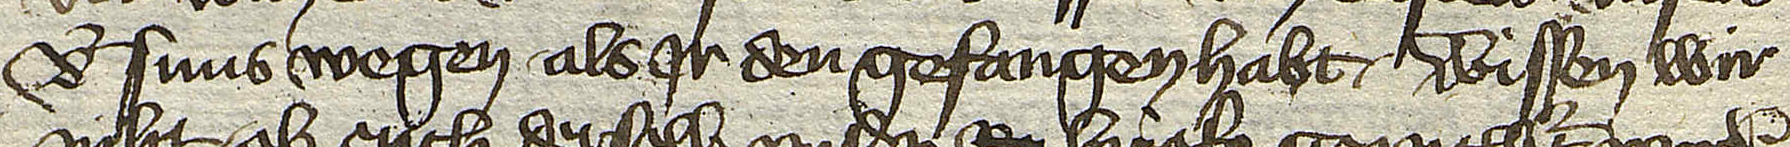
B* ſuns wegen / als Ir den gefangen habt / wiſſen wir
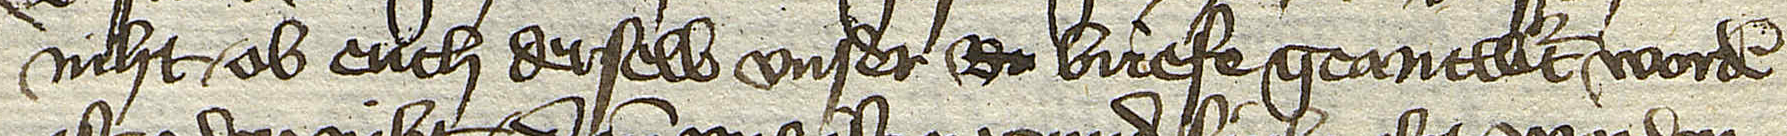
niht / ob euch derſelb vnſer B briefe geantw*t worde*
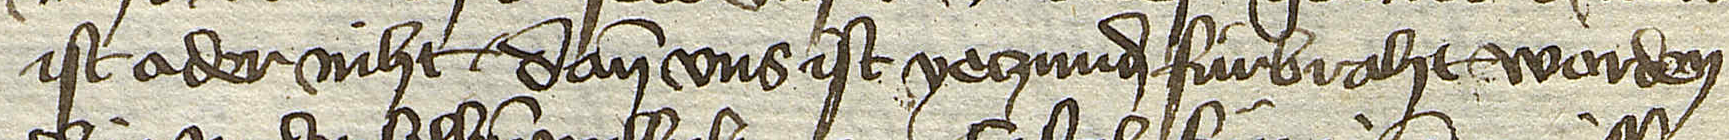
iſt oder niht / Dan* vns iſt yecʒund* fürbraht worden
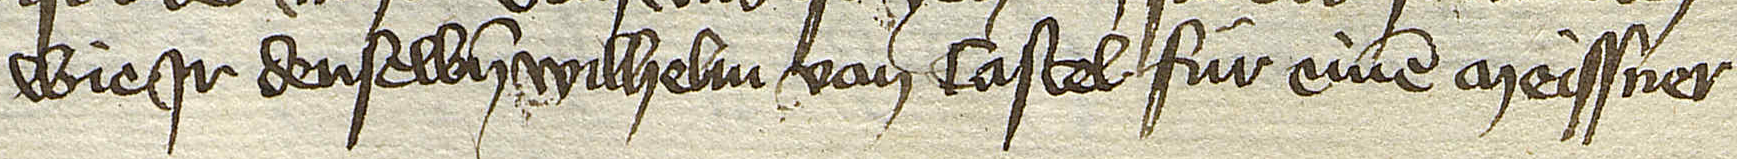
wie Ir denſelbn* wilhelm von Caſtel für eine* Meiſſner
